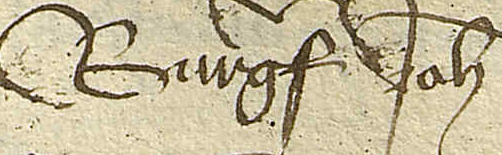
Burgf* Ioh*
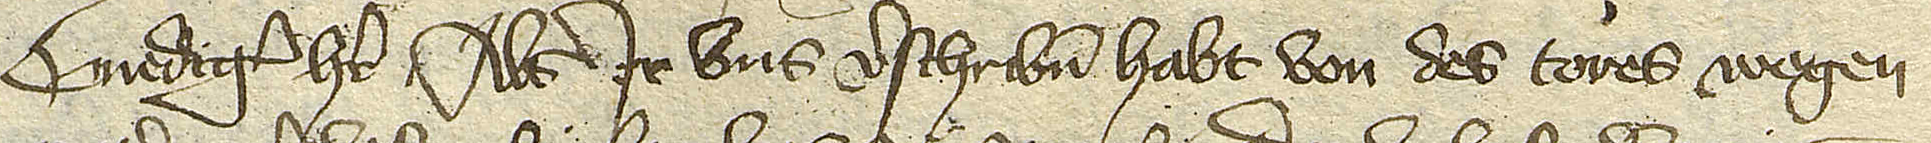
Gnedig* hr* / Als Ir vns v*ſchribn* habt von des tores wegen
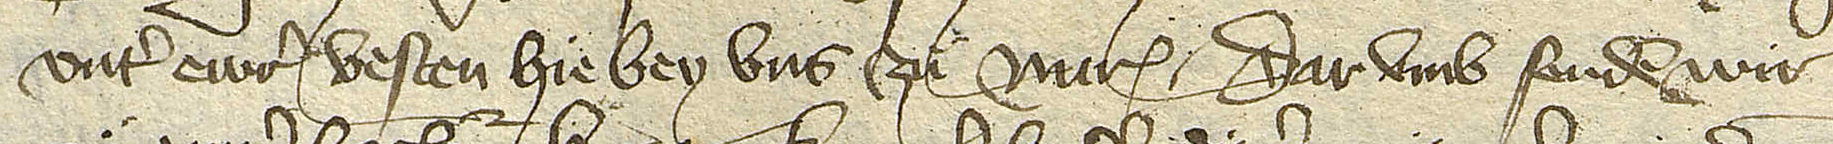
vnt* ewr* veſten hie bey vns cʒü Nur* / Dar vmb ſend* wir
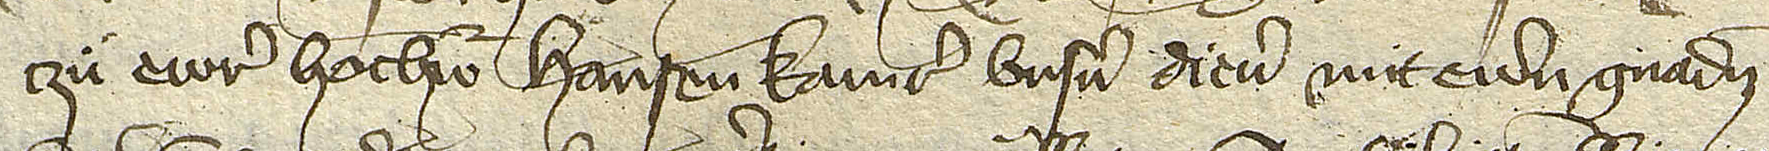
cʒü ewr* hochw* hanſen Kamr* vnſn* dien* mit ewn* gnadn*
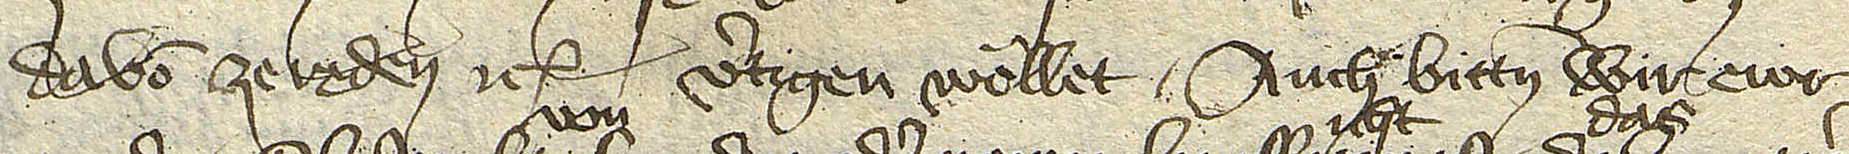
davo* cʒereden ec* / v*tigen wöllet / Auch bittn* wir ewr
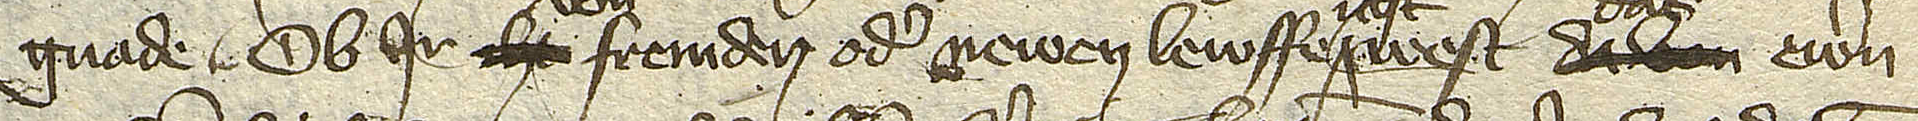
gnade / Ob Ir iht fremden od* newen lewffe weſt davon ew*n
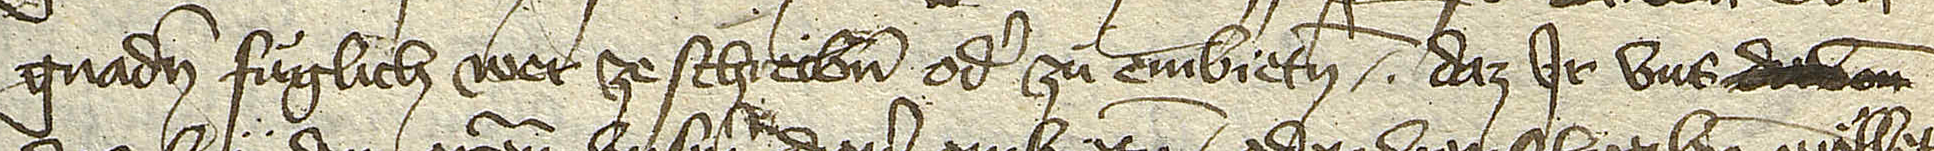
gnadn* füglich wer cʒe ſchreibn* od* cʒü embietn* / . daʒ Ir vns davon*
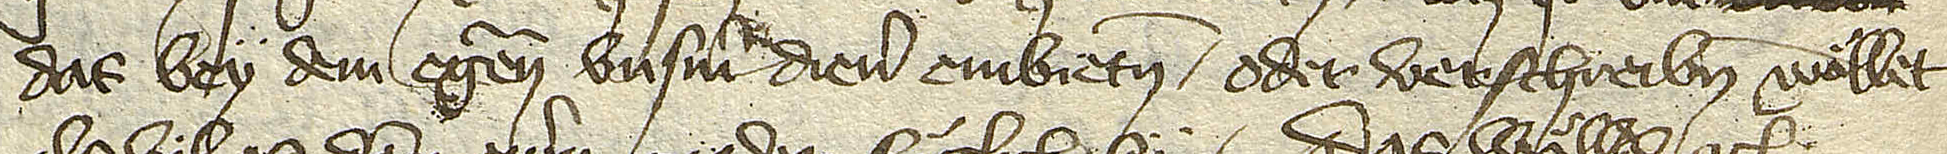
das bey dem egen* vnſm* dien* embietn* / oder verſchreibn* wöllet
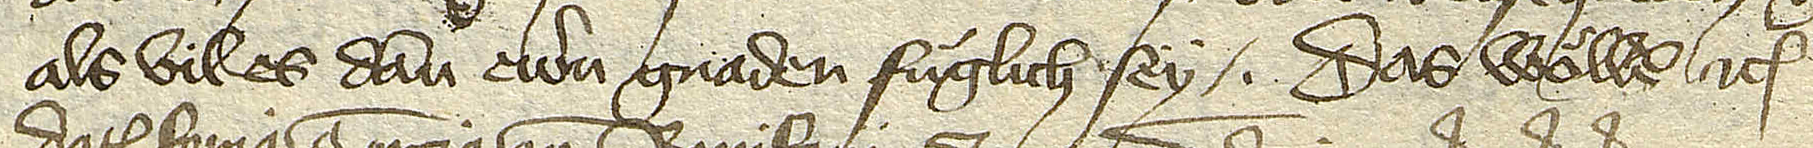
als vil es dan* ewn* gnaden füglich ſey / . Das wölle* ec*
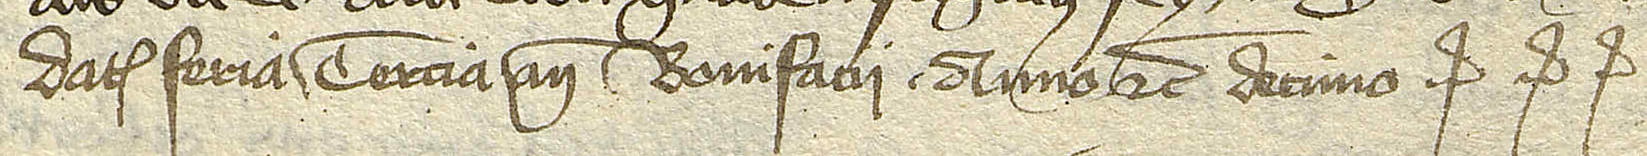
dat* feria Tercia an* Bonifacii / Anno ec* decimo § § §
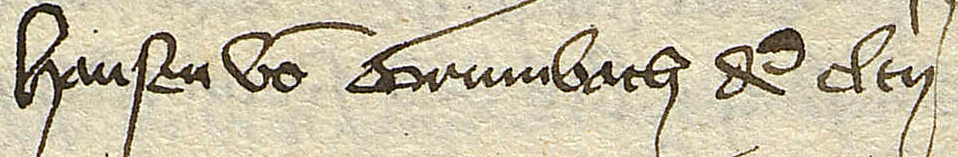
hanſen vo* Grumbach d* eltn*
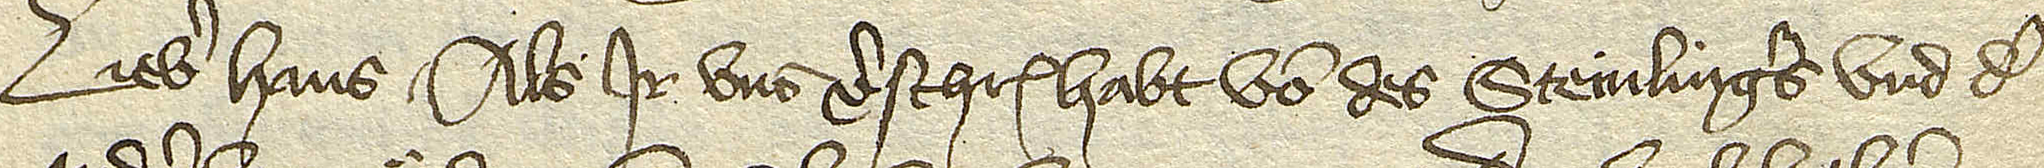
Lieb* hans / Als Ir vns v*ſchr* habt vo* des Steinling*s vnd d*
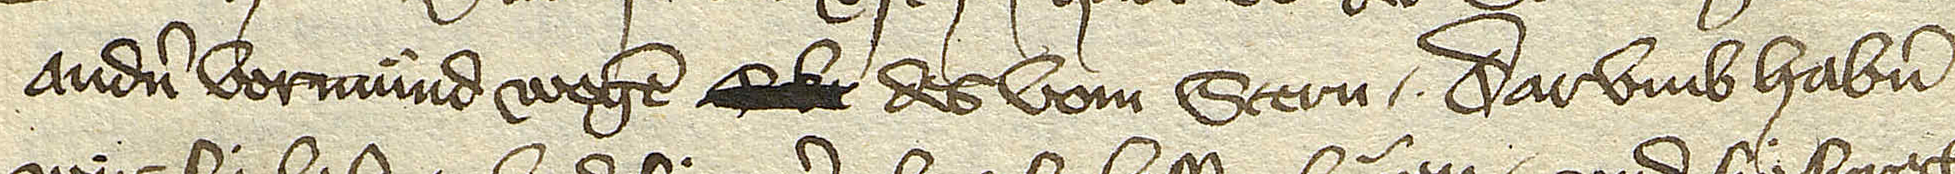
andn* vormünd wege* %%% des vom Stern / . Darvmb habn*
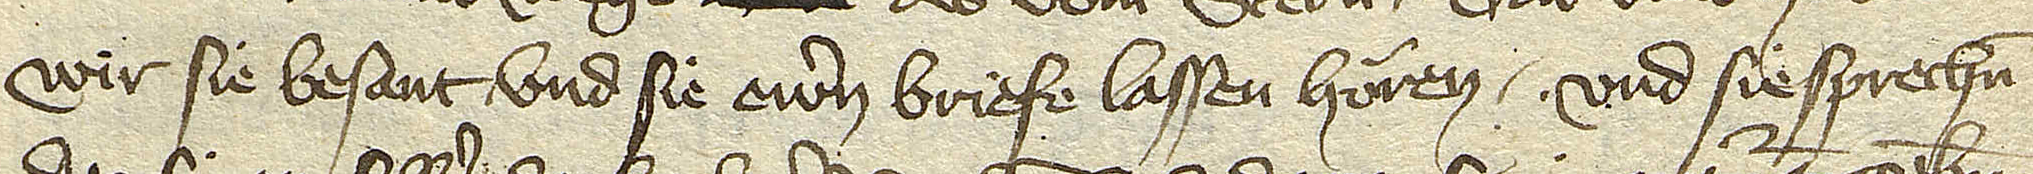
wir ſie beſant / vnd ſie ew*n briefe laſſen hören / . vnd ſie ſprechn*
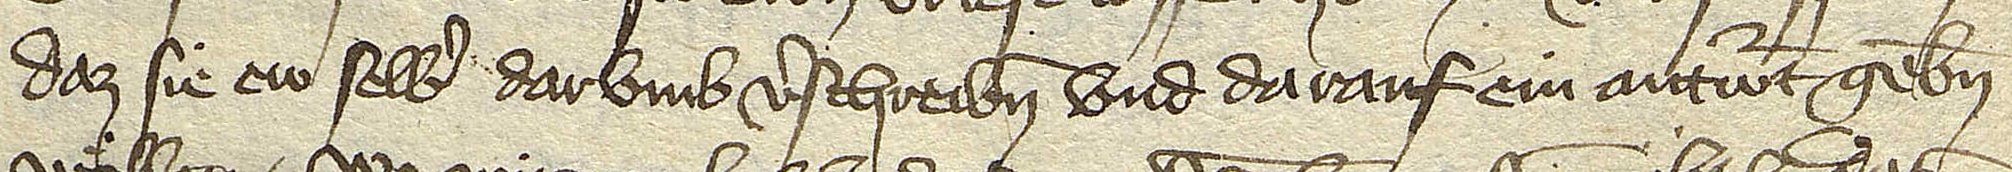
daʒ ſie ew ſelb* darvmb v*ſchreibn* vnd darauf ein antw*t gebn*
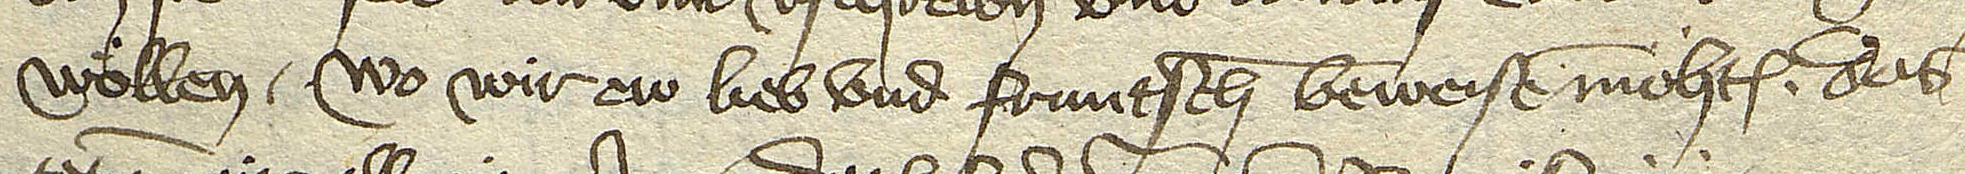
wöllen / wo wir ew lieb vnd fruntſch* beweiſe* möht* . Das
